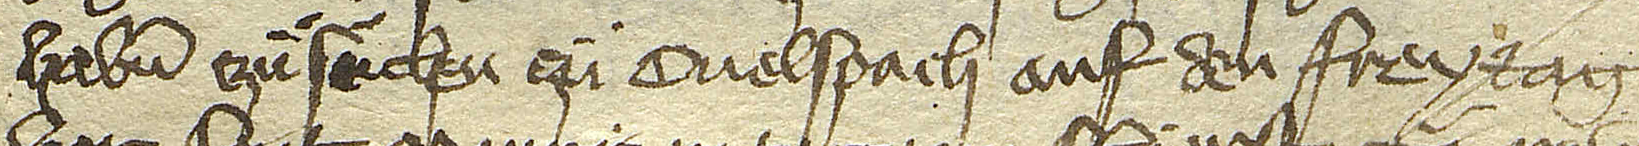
habn* cʒü ſüchen cʒü Onelſpach auf den freytag
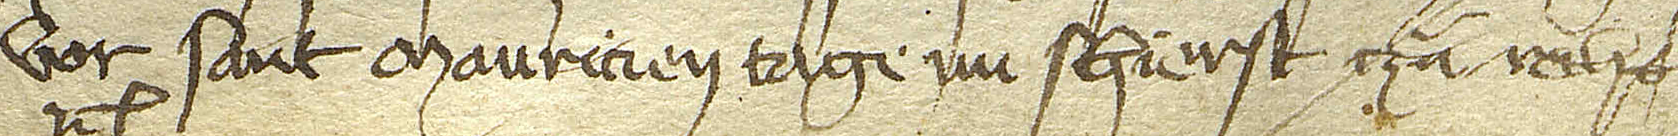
vor ſant Mauricien tage nu ſchierſt cʒü recht*
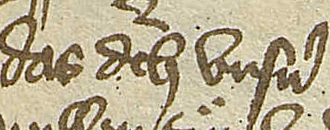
das d*ch vnſn*
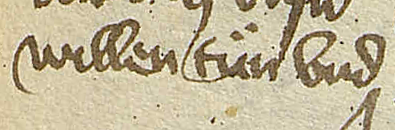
willen tün vnd
